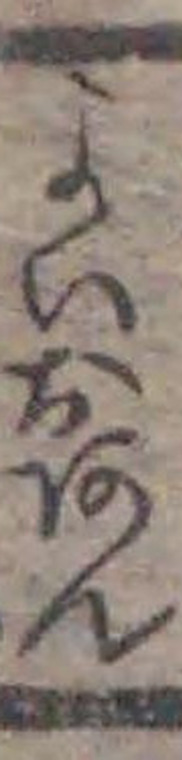よいおあん
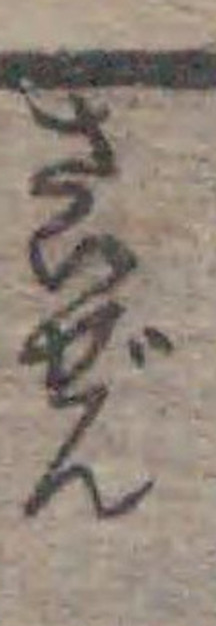さいぜん
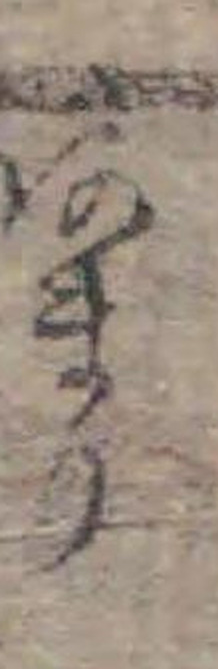あまり
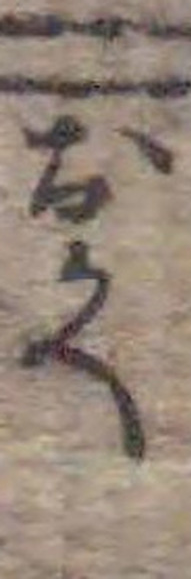おかへ
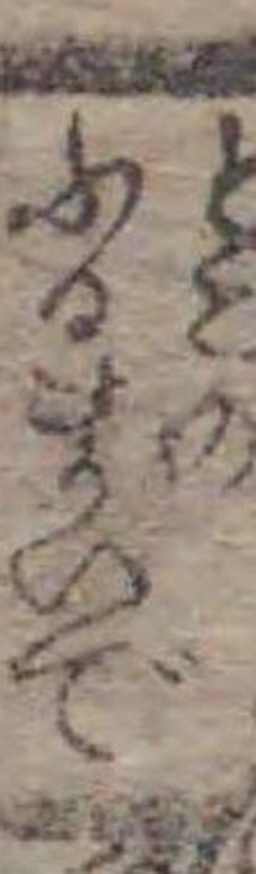ふるまいで
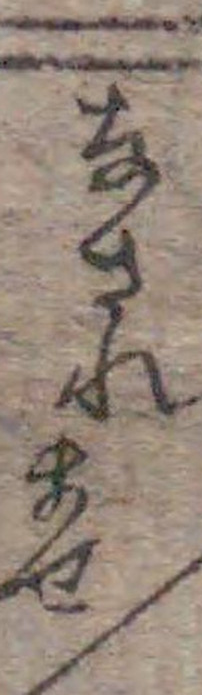なされませ
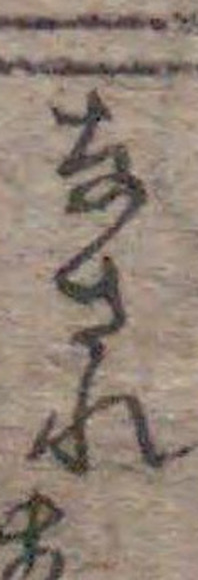なされ
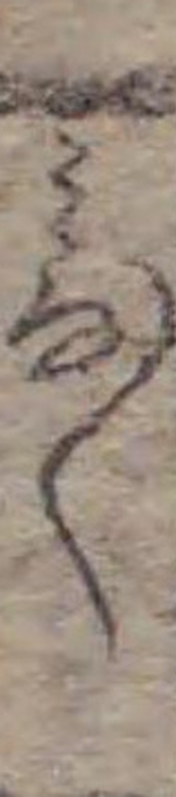みな〳〵
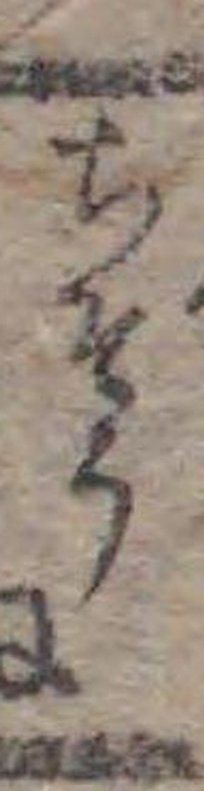ちそうに
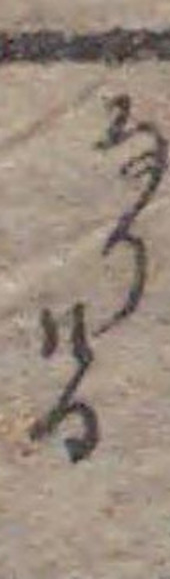なりける
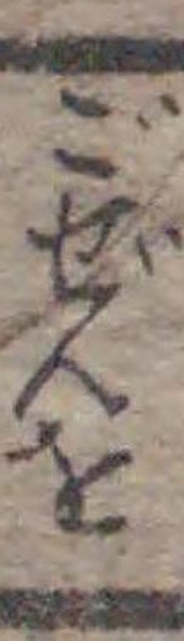ごぜんを
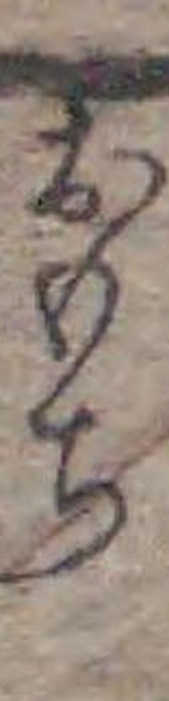おもち
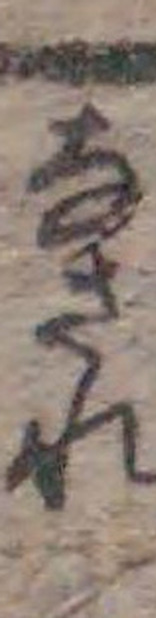なされ

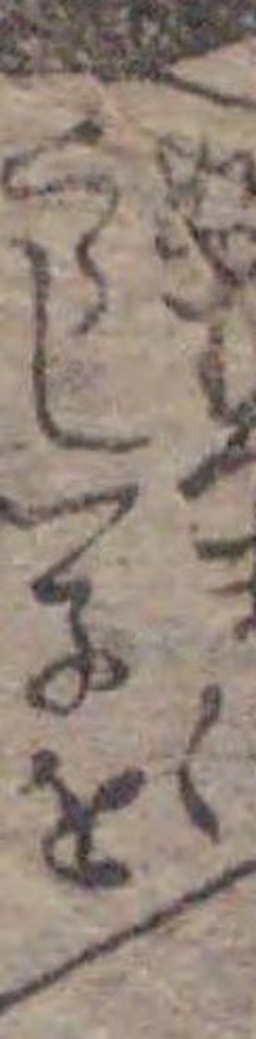くらし一子を
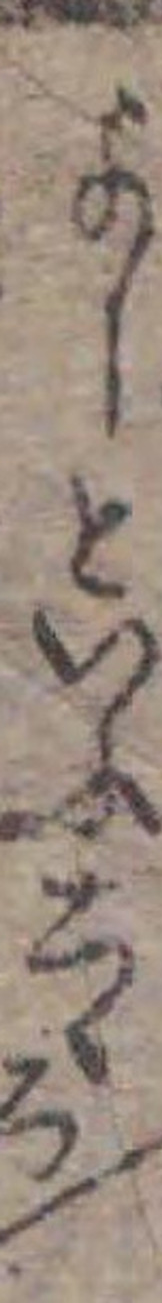よしといふこゝろ
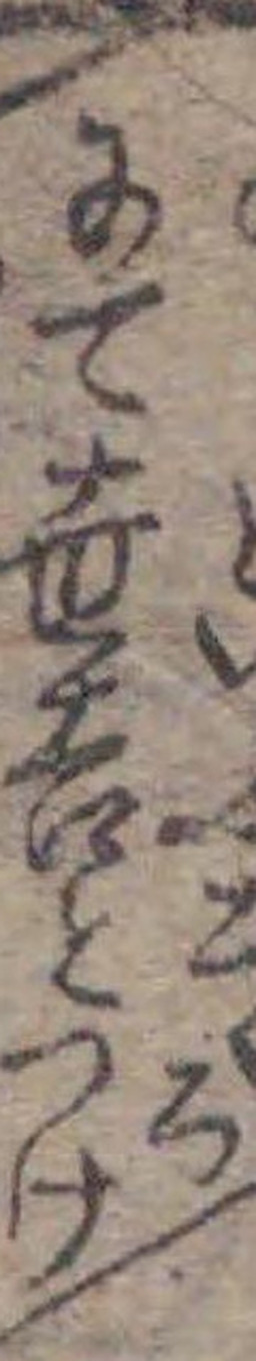にて世吉とつけ
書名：神田与吉一代記 : 3巻
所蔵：国立国会図書館 National Diet Library, JAPAN
